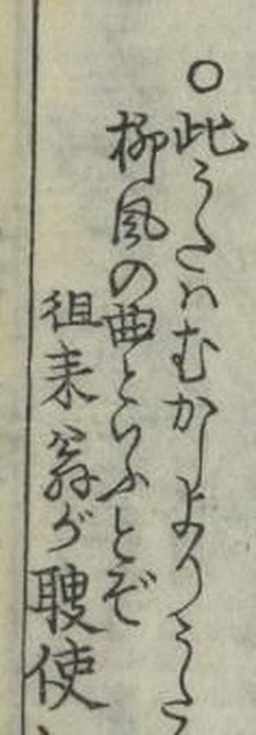柳風の曲といふとぞ
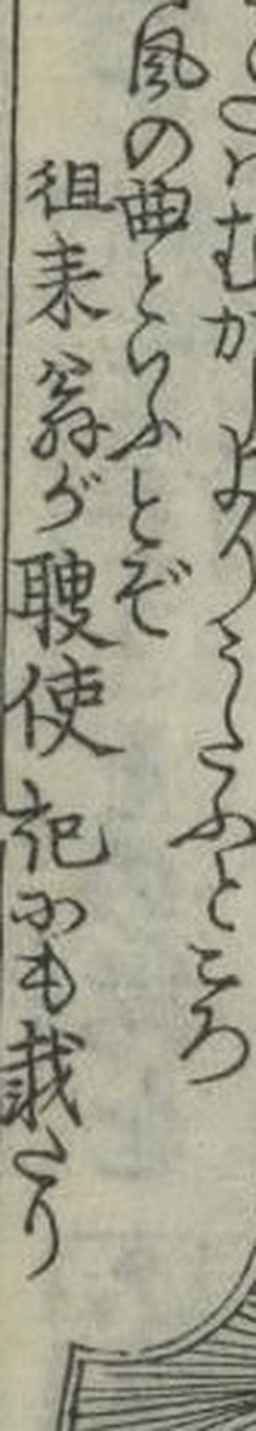徂来翁が聘使記にも載たり

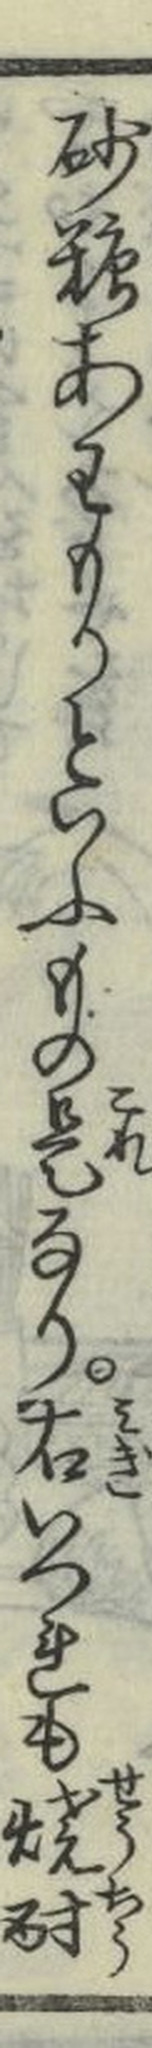砂糖あわもりといふもの是なり。右いつれも焼酎
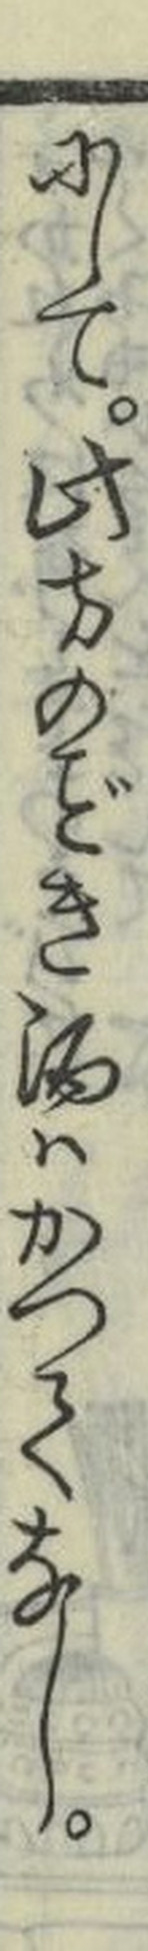にして。此方のごとき酒はかつてなし。
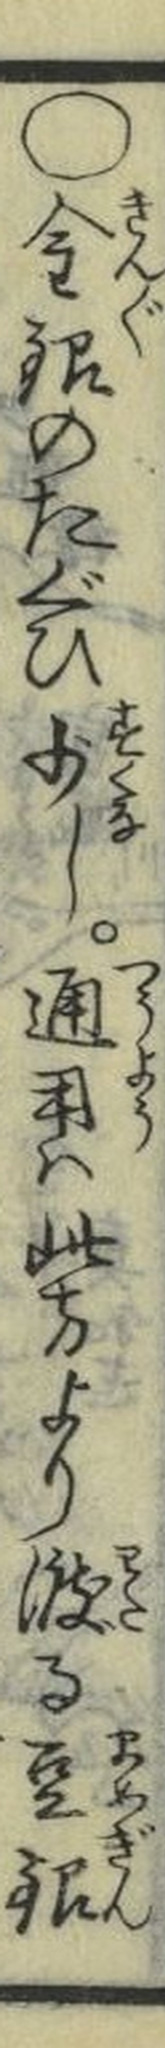○金銀のたぐひ少し。通用は此方より渡る豆銀
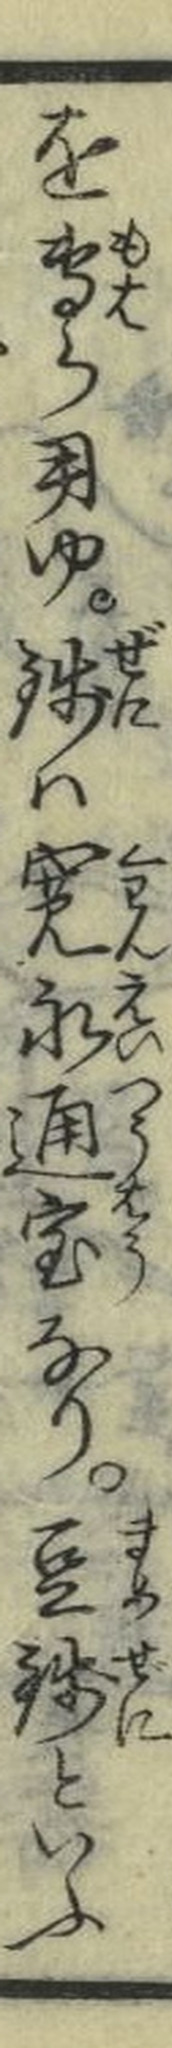を専ら用ゆ。銭は寛永通宝なり。豆銭といふ
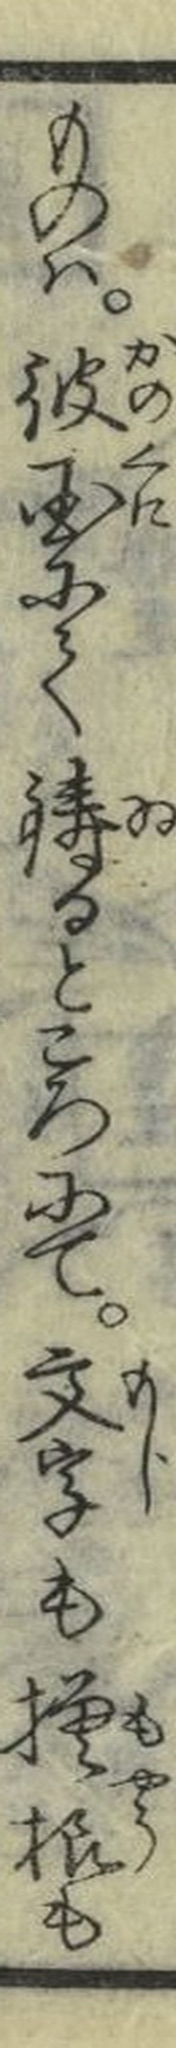ものは。彼国にて鋳るところにて。文字も模様も
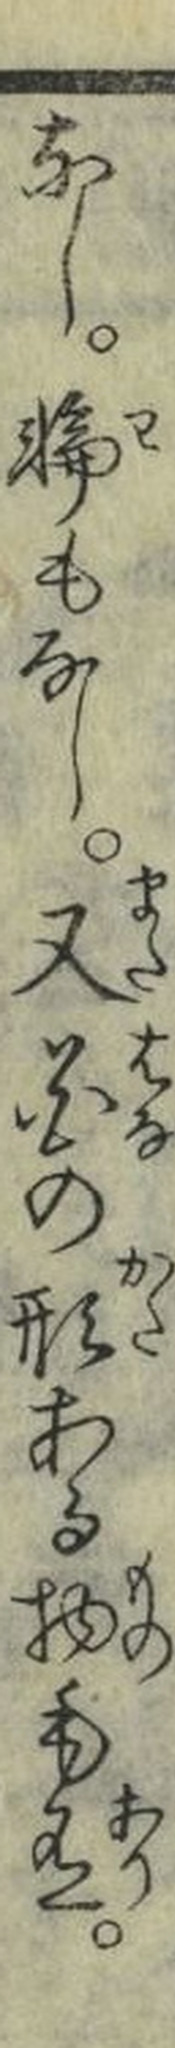なし。輪もなし。又花の形ある物も有。
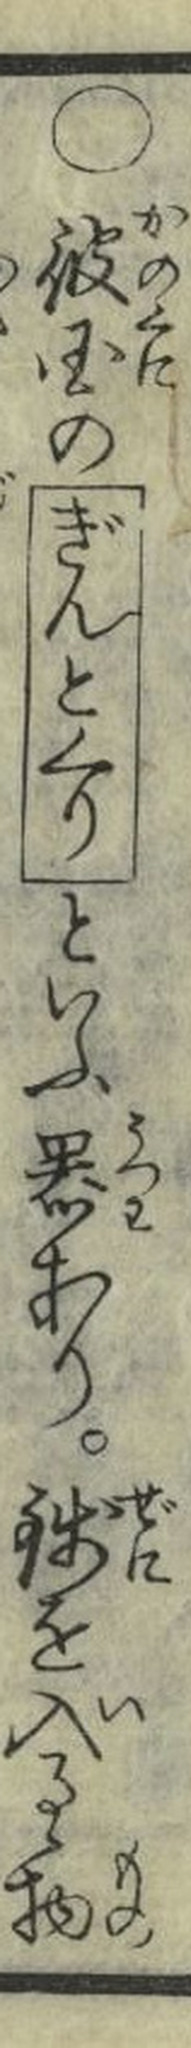○彼国の「ぎんとくり」といふ器あり。銭を入る物
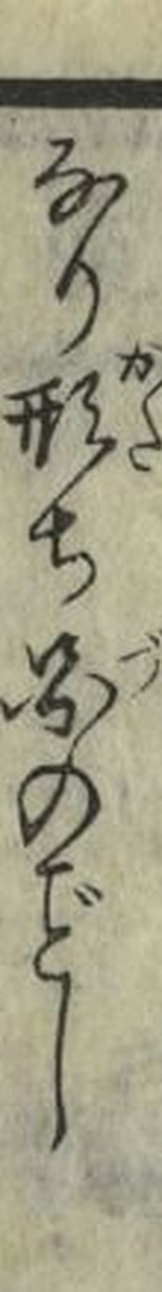なり形ち豆のごとし。
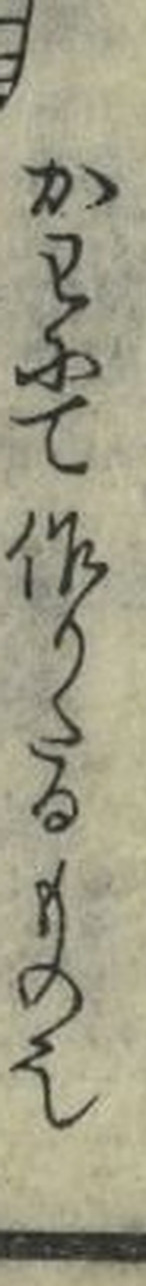かわにて作りたるもの也
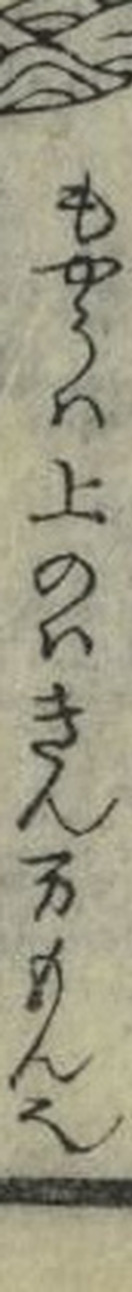もやうは上のはきん万もん也
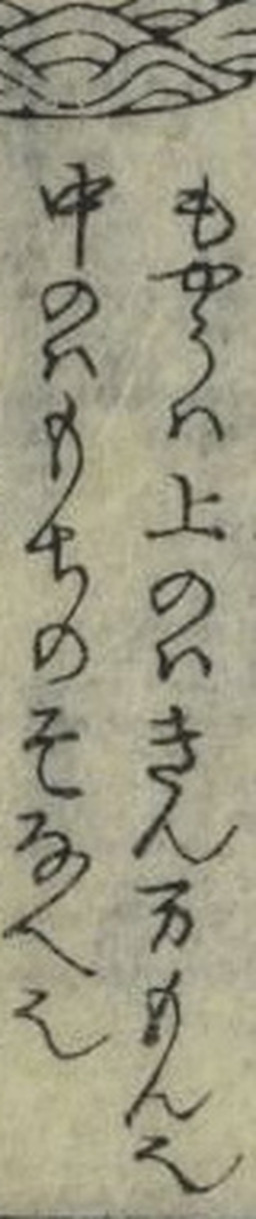中のはもちのそなへ也
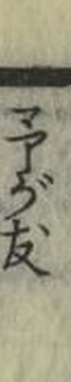予が友
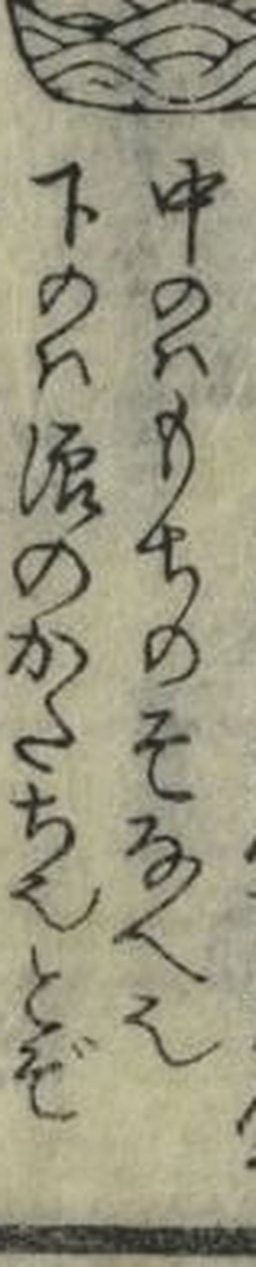下のは浪のかたち也とぞ
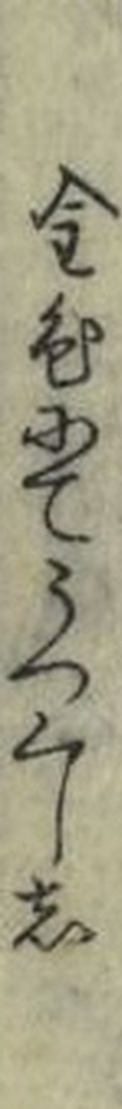金色にてうつくしし
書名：琉球奇譚
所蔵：University of the Ryukyus Library
